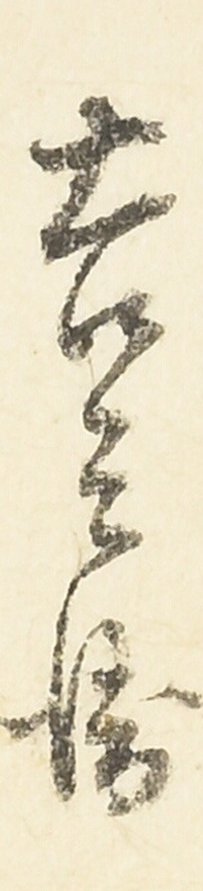吉兵衛
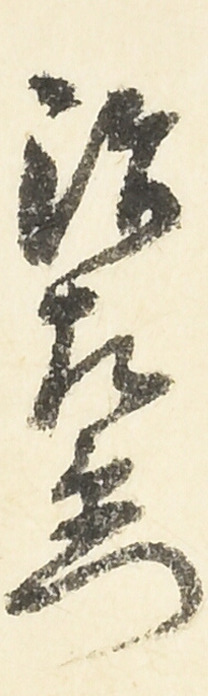藤左衛門
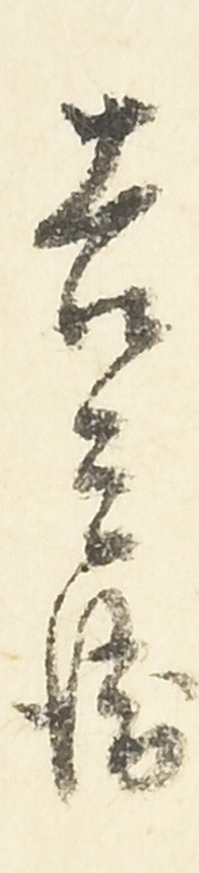吉兵衛
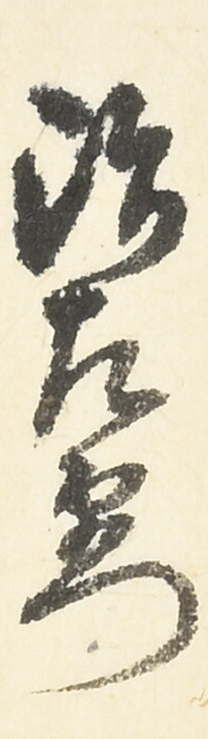藤左衛門
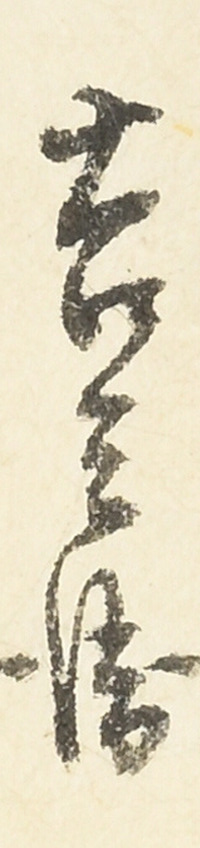吉兵衛
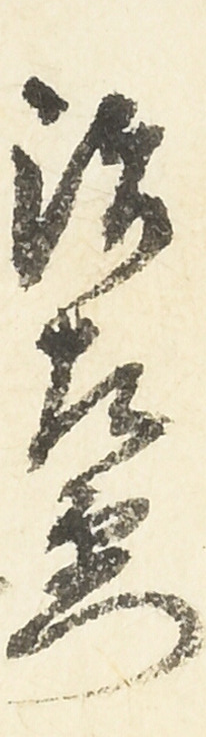藤左衛門
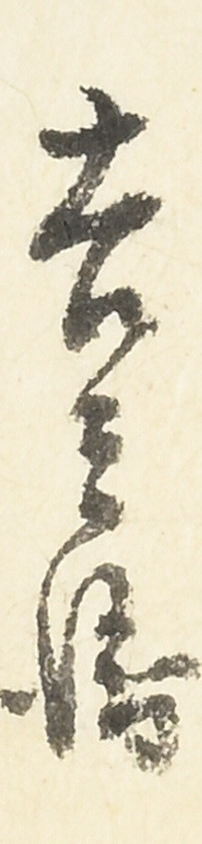吉兵衛
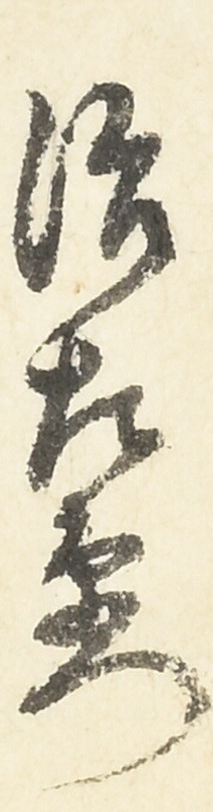藤左衛門
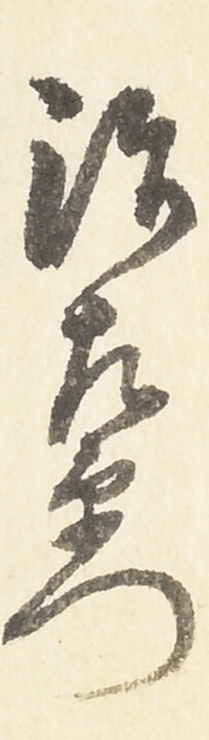藤左衛門

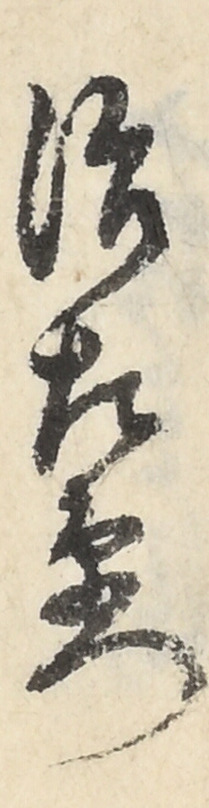藤左衛門
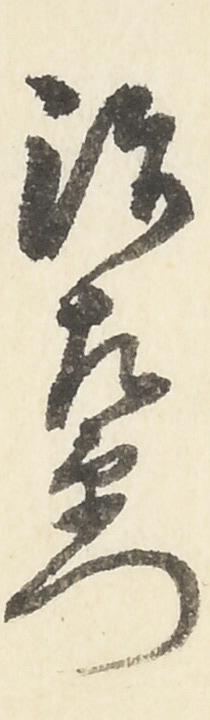藤左衛門
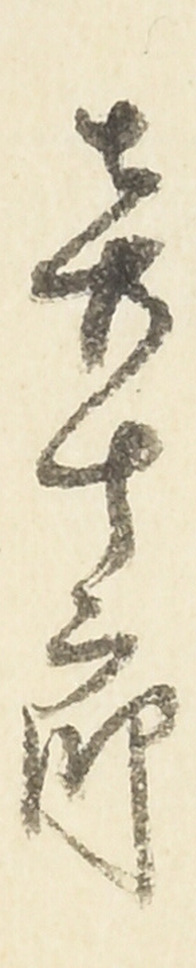喜十郎
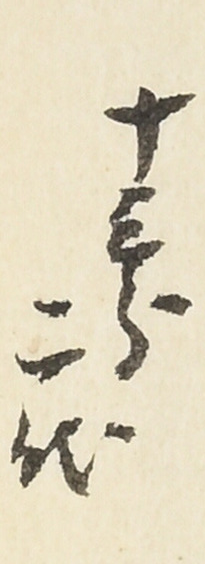十三郎宗八
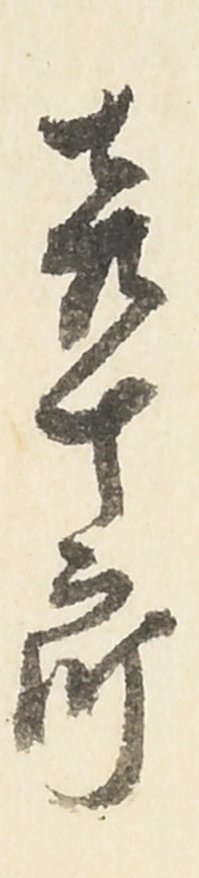喜十郎
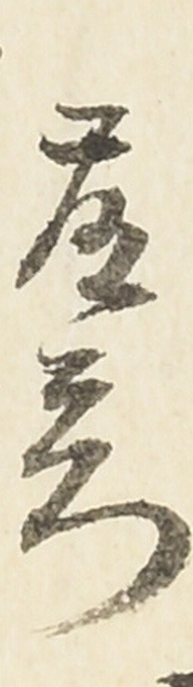藤左衛門
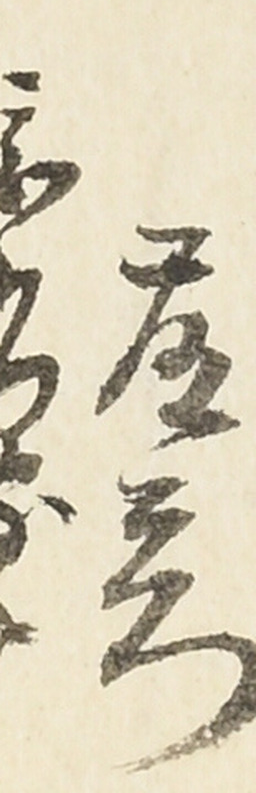甚左衛門
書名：鉾持町丁代勤役年歴順控
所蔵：伊那市立高遠町図書館・合同会社AMANE
